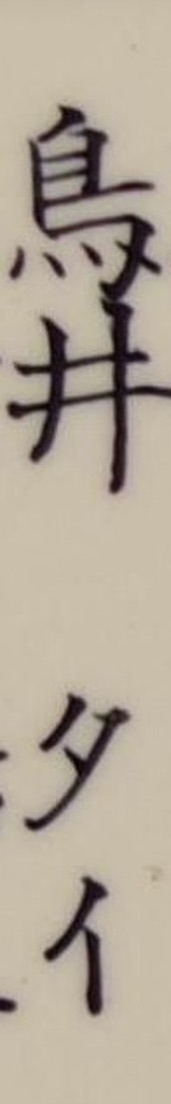鳥井タイ
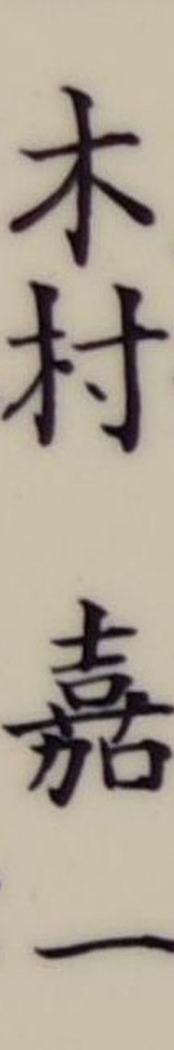木村嘉一
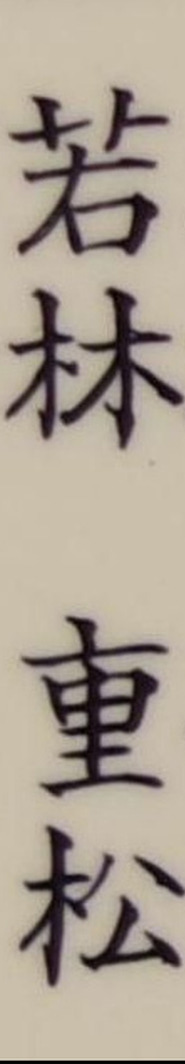若林重松
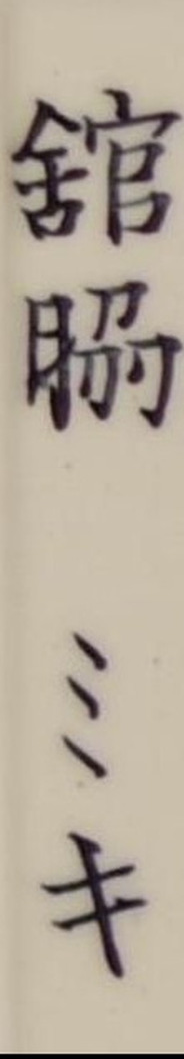舘脇ミキ

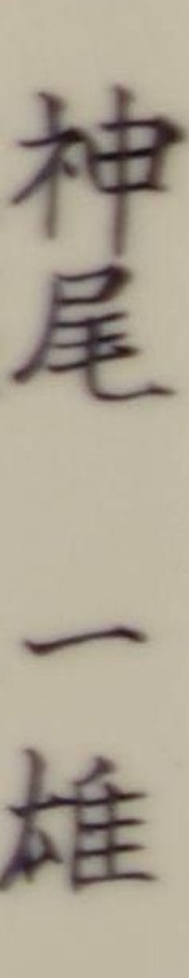神尾一雄
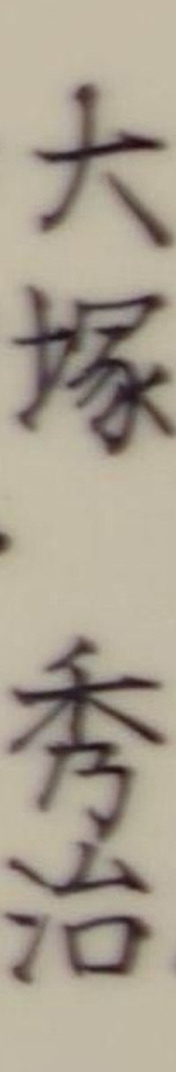大塚秀治
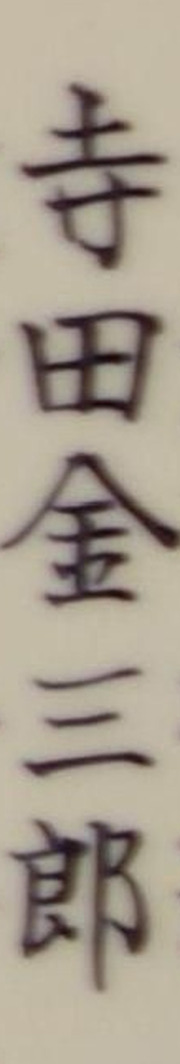寺田金三郎
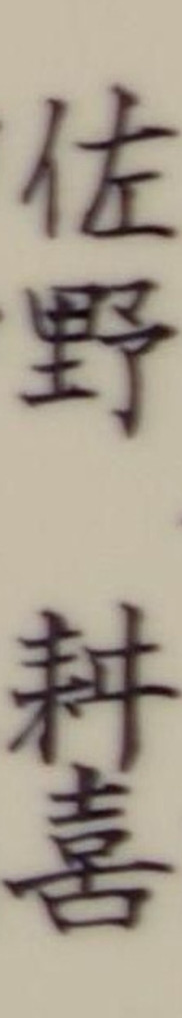佐野耕喜
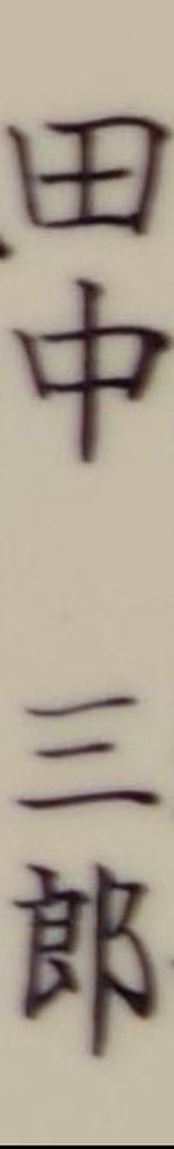田中三郎
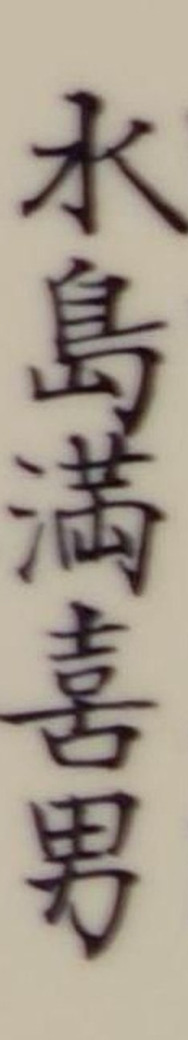水島満喜男
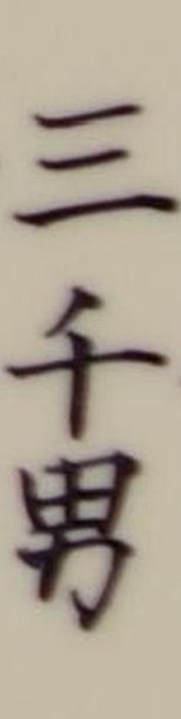三千男
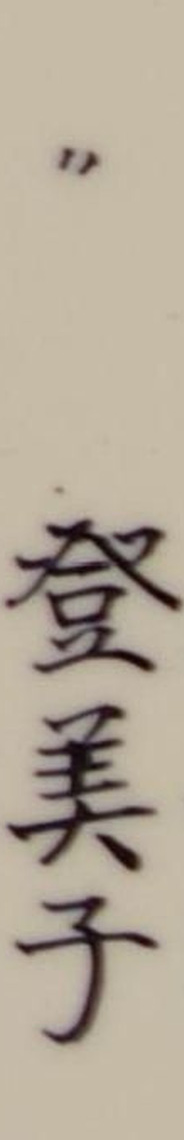登美子
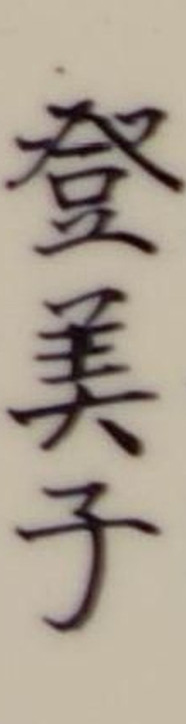登美子
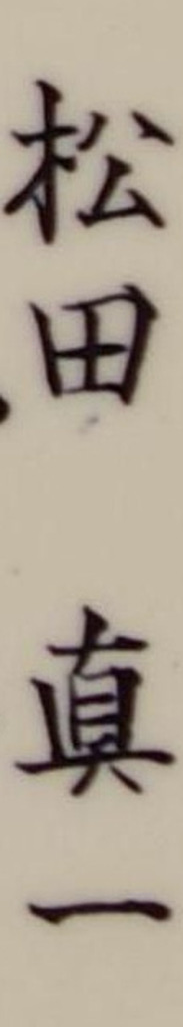松田真一
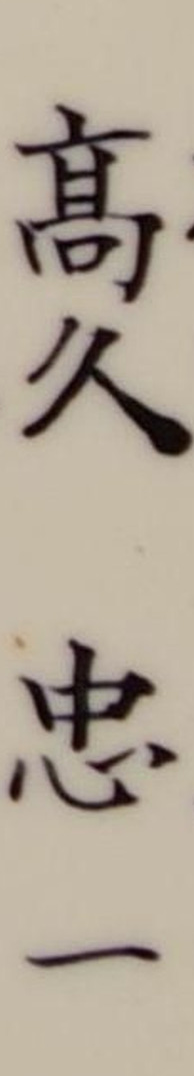高久忠一
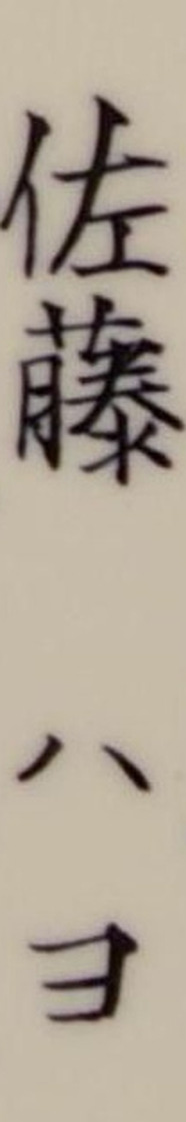佐藤ハヨ
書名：M~S
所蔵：高野山金剛峯寺
